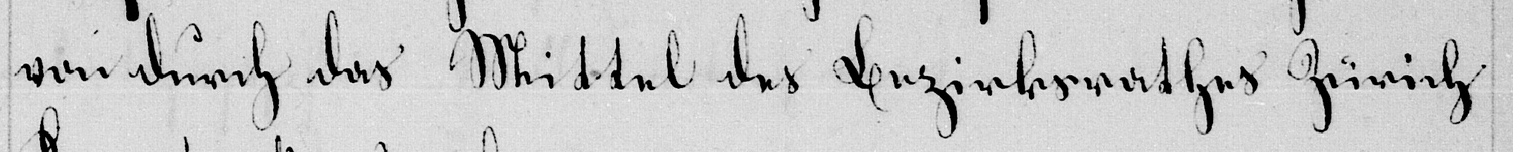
von durch das Mittel des Bezirksrathes Zürich
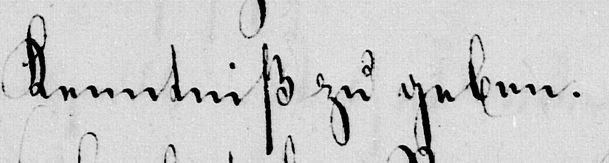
Kenntniß zu geben.
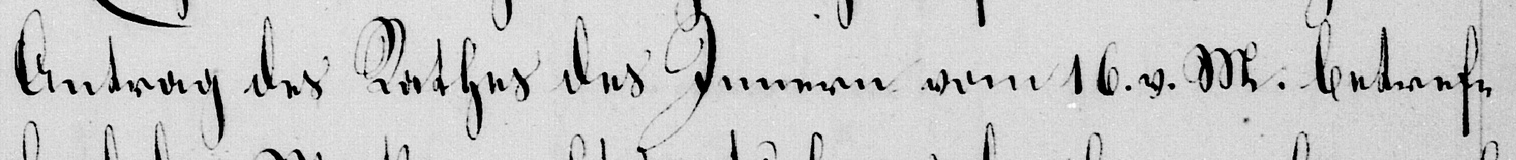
Antrag des Rathes des Innern vom 16. v. M. betref¬
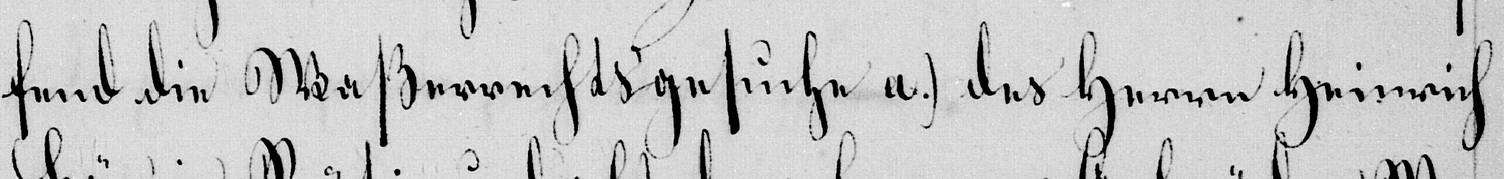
fend die Waßerrechtsgesuche a.) des Herrn Heinrich
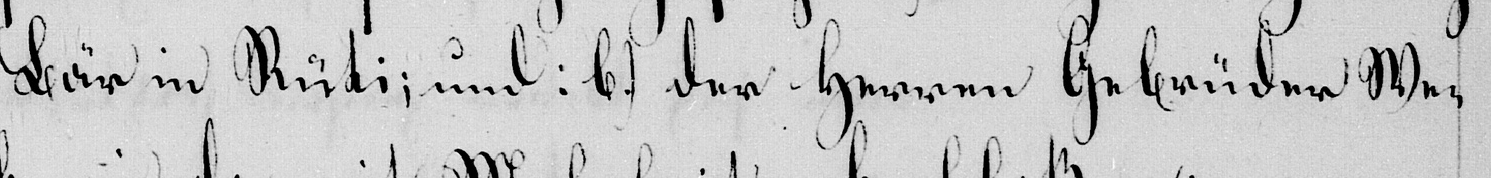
Bär in Rüti; und: b.) der Herren Gebrüder We¬
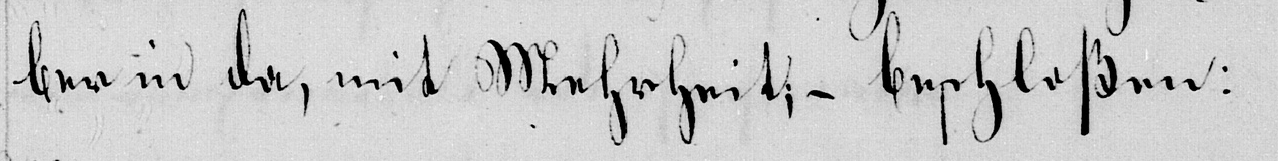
ber in da, mit Mehrheit; – beschloßen:
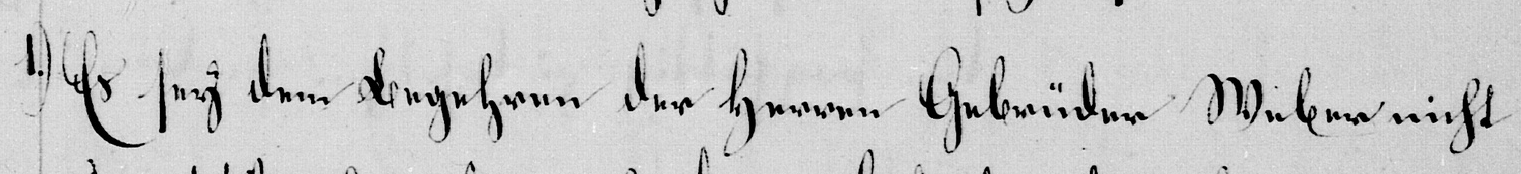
Es sey dem Begehren der Herren Gebrüder Weber nicht
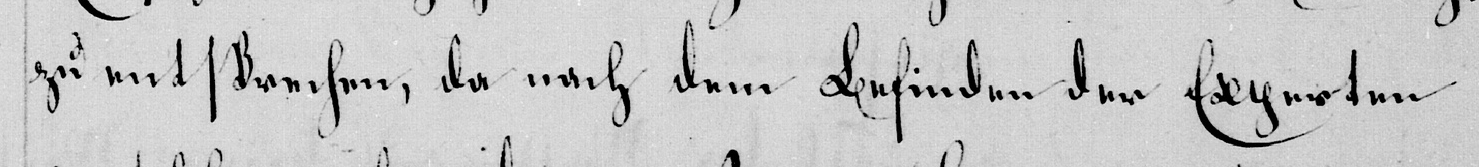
zu entsprechen, da nach dem Befinden der Experten
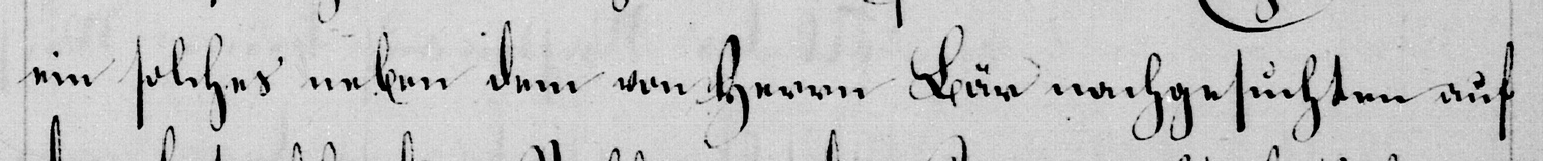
ein solches neben dem von Herrn Bär nachgeführten auf
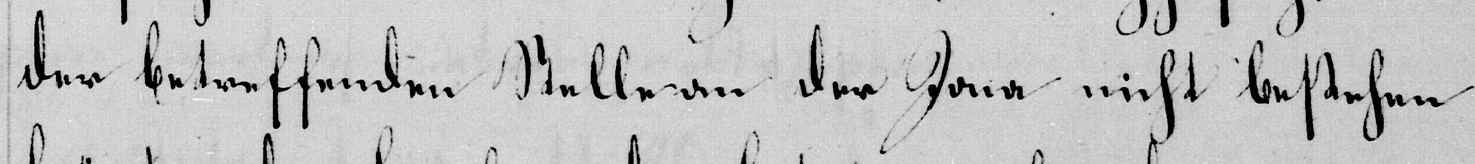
der betreffenden Stelle an der Jona nicht bestehen
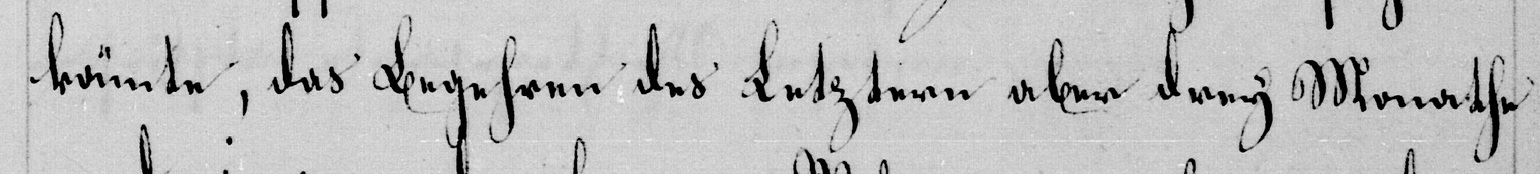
könnte, das Begehren des Letztern aber drey Monathe
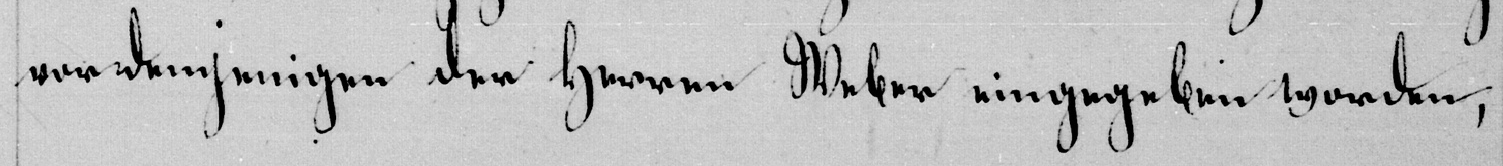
vor demjenigen der Herren Weber eingegeben worden,
